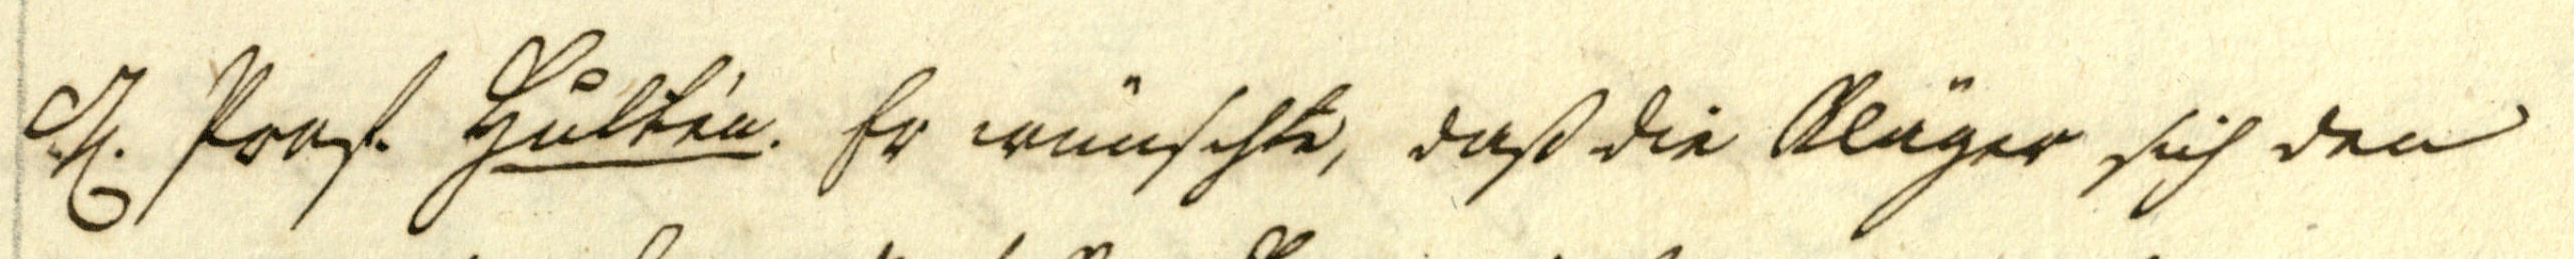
dh. Prof. Hultén. Er wünschte, daß die Kläger sich den
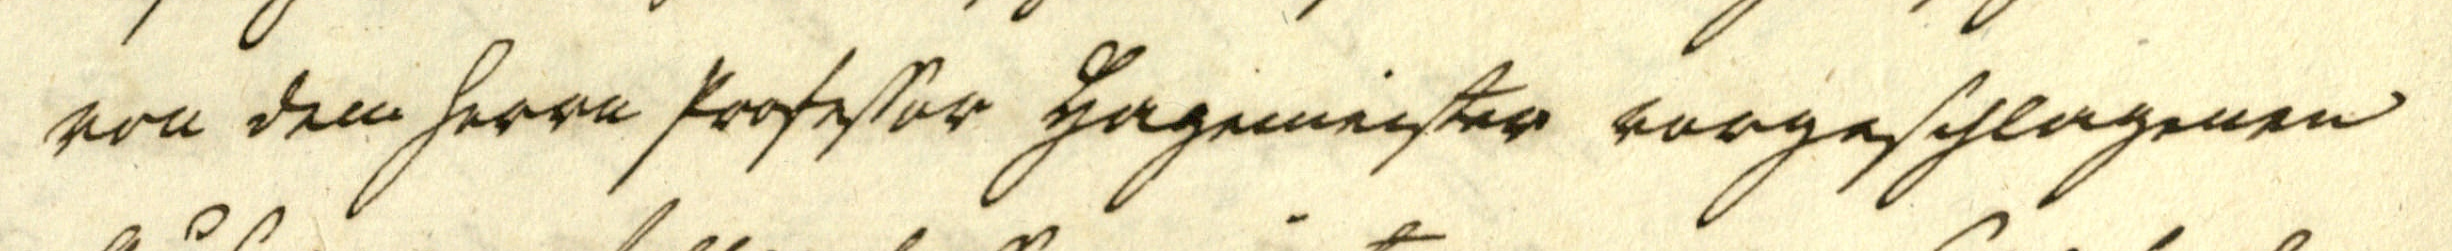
von dem Herrn Professor Hagemeister vorgeschlagenen
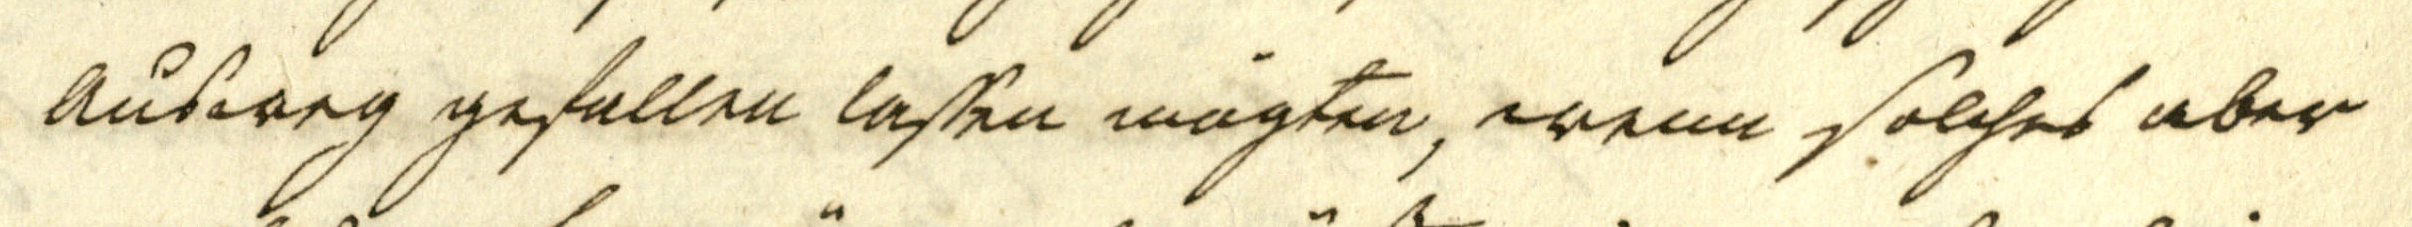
Ausweg gefallen lassen mögten, wenn solches aber
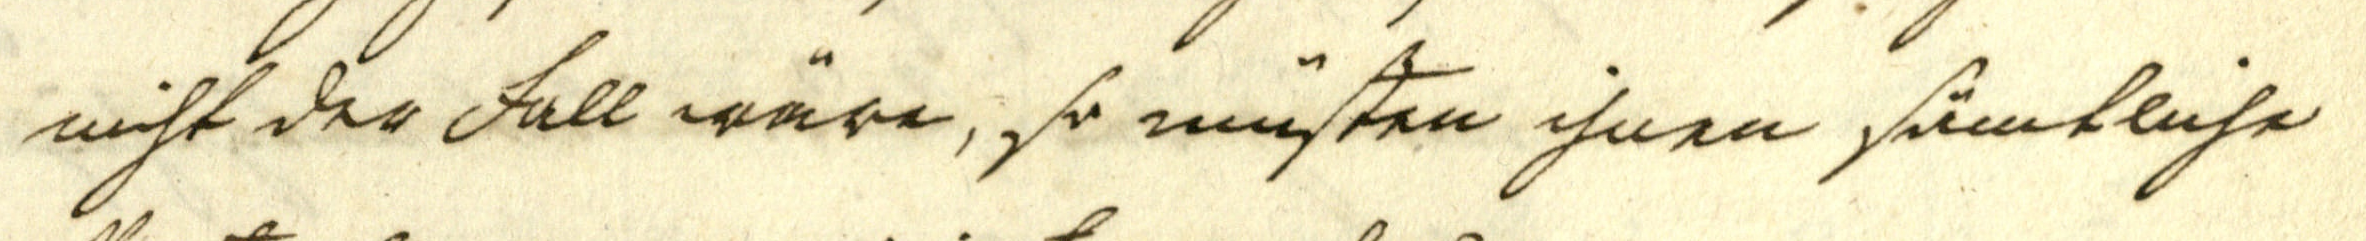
nicht der Fall wäre, so müßten ihnen sämtliche
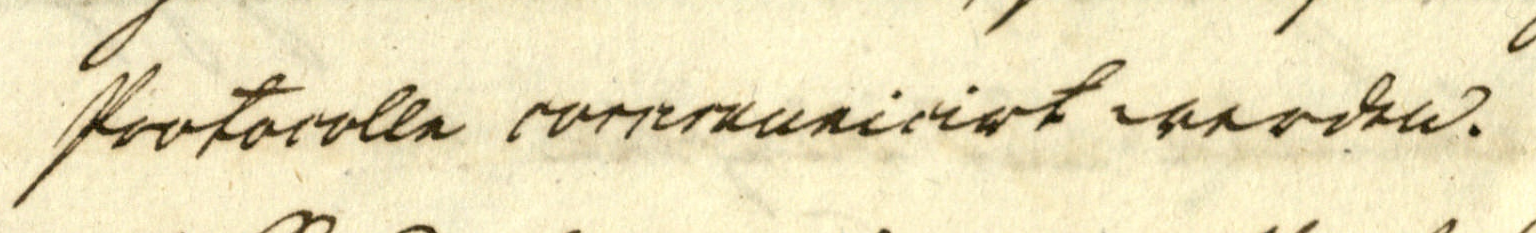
Protocolle communicirt werden.
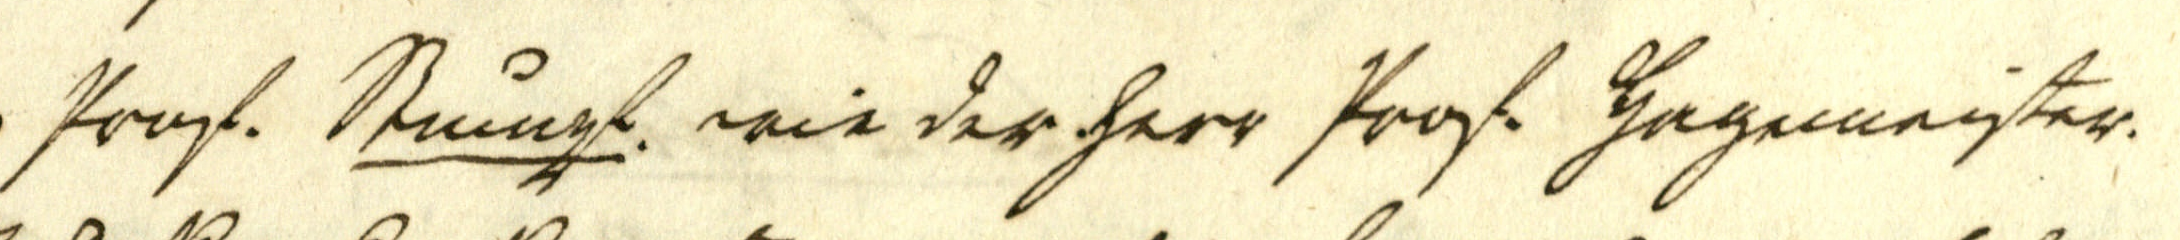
Prof. Stumpf. wie der Herr Prof. Hagemeister.
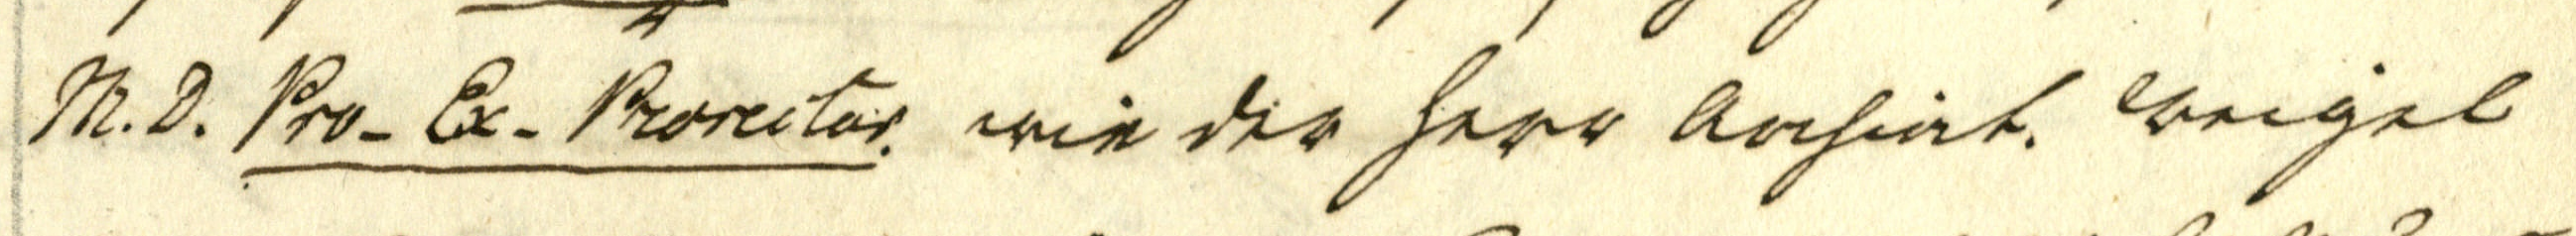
M. D. Prof. Ex. Prorector wie der Herr Archiat. Weigel
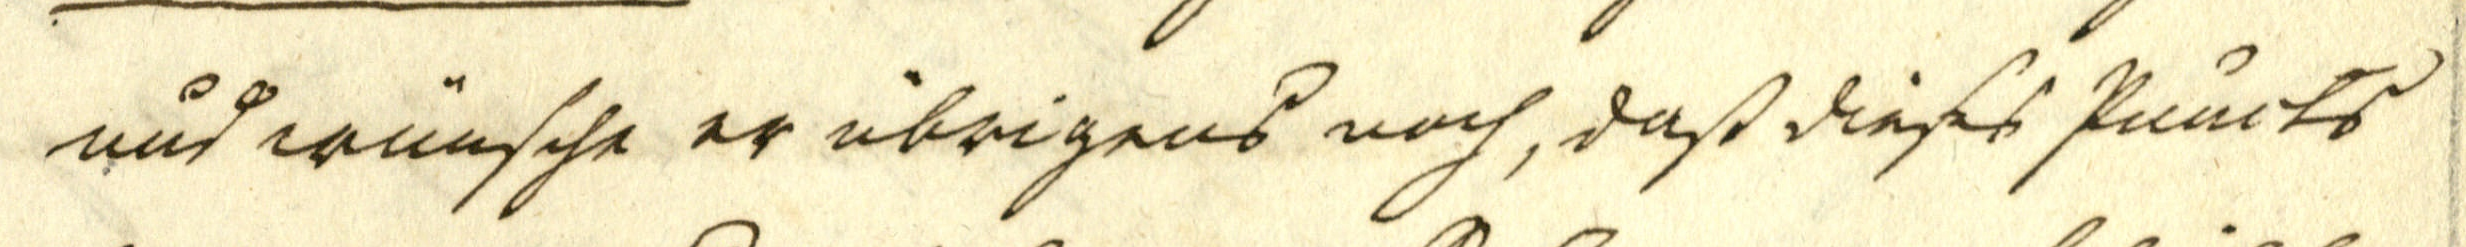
und wünsche er übrigens noch, daß dieses Puncts
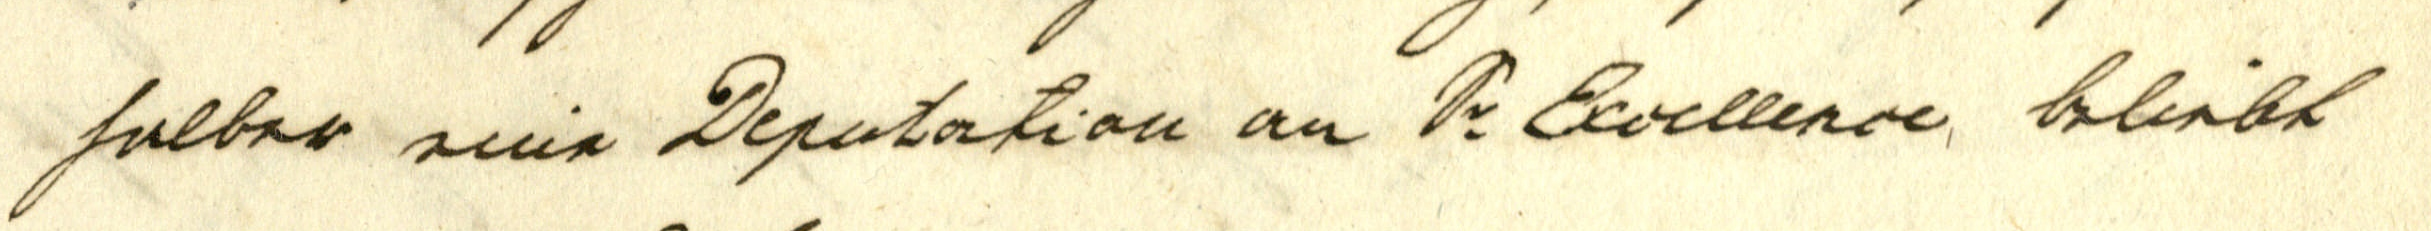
halber eine Deputation an Sr Excellence beliebt
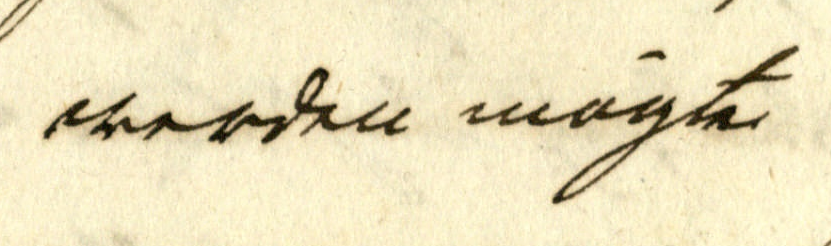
werden mögte
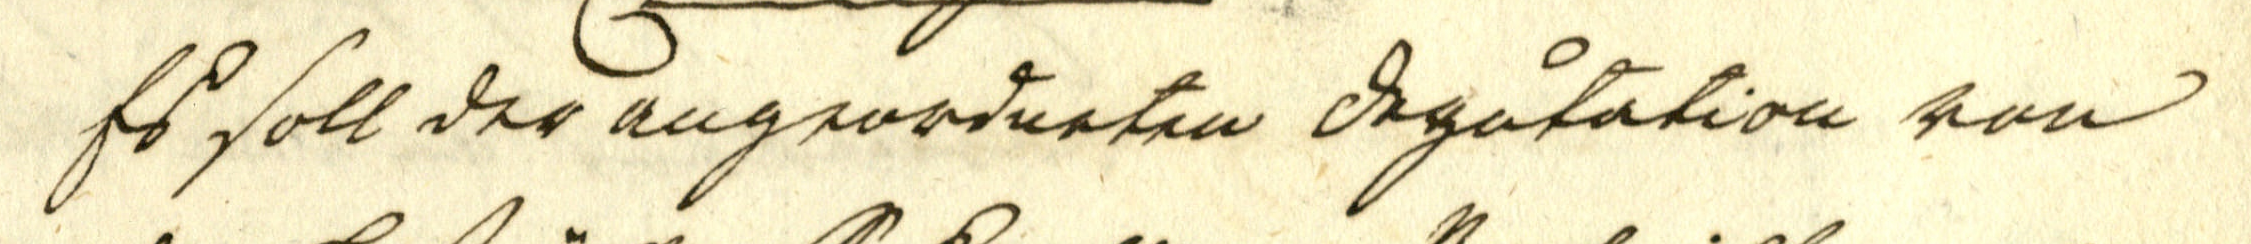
Es soll der angeordneten Deputation von
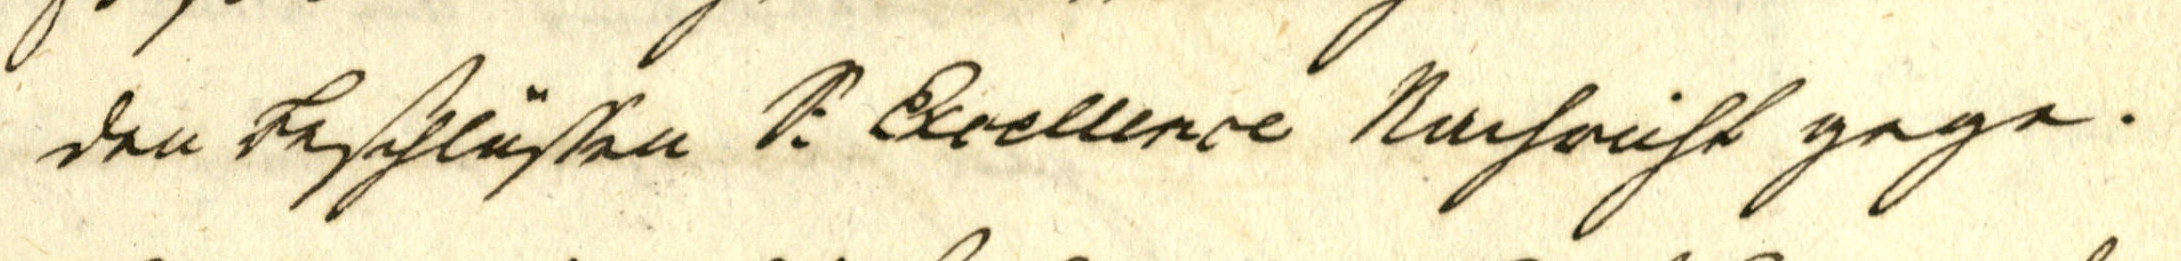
den Beschlüssen Sr Excellence Nachricht gege¬
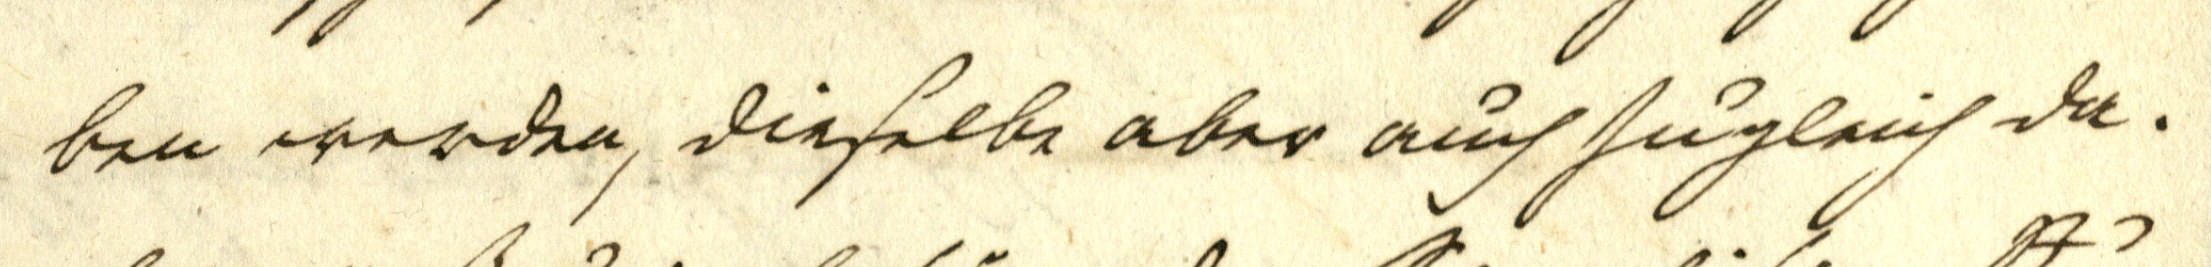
ben werden, dieselbe aber auch zugleich da¬
